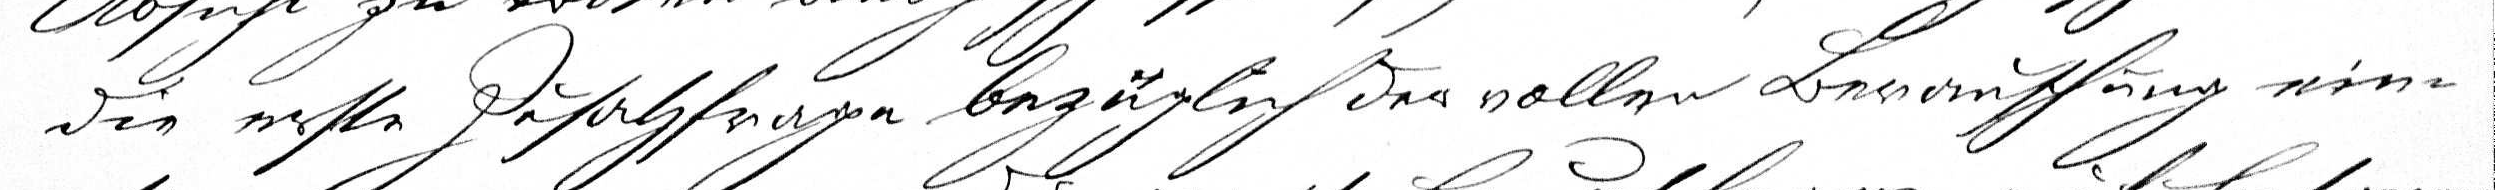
die erste Zusatzfrage bezüglich der vollen Berauschung ein¬
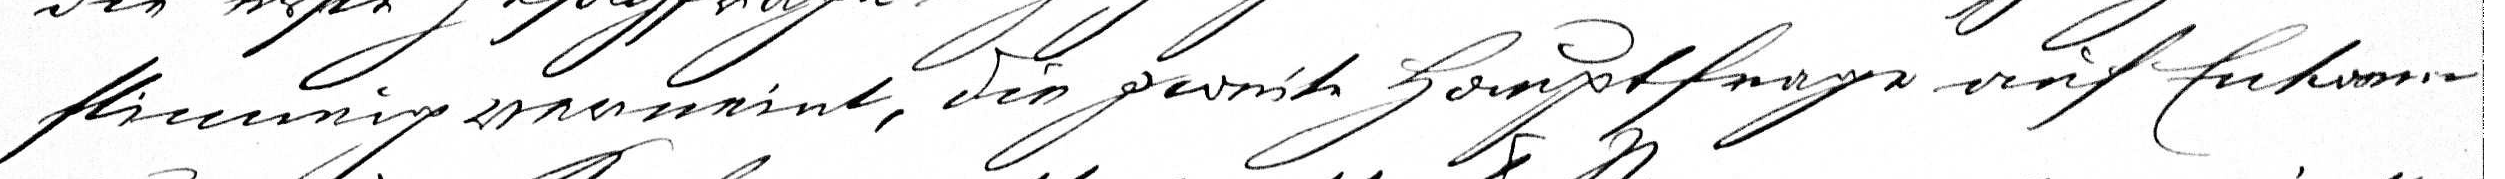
simmig verneint, die zweite Hauptfrage auf Entwen¬
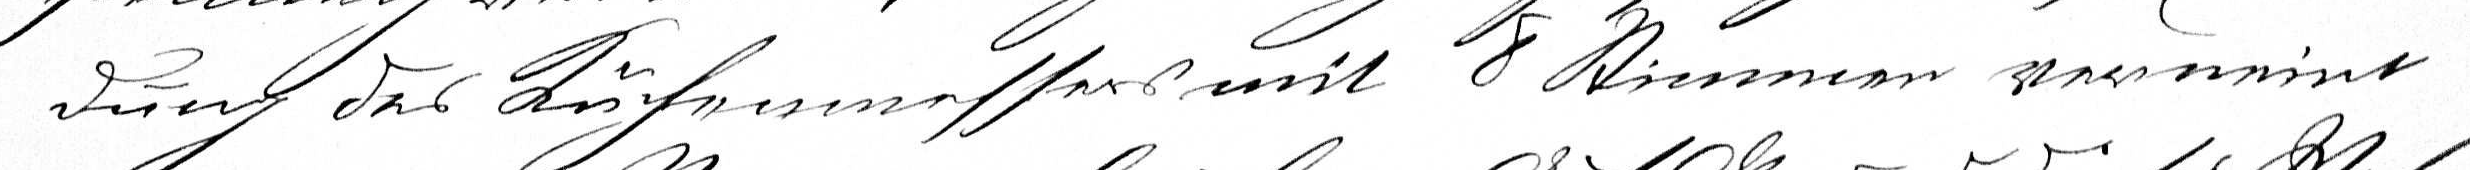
dung des Küchenmessers mit 8 Stimmen verneint
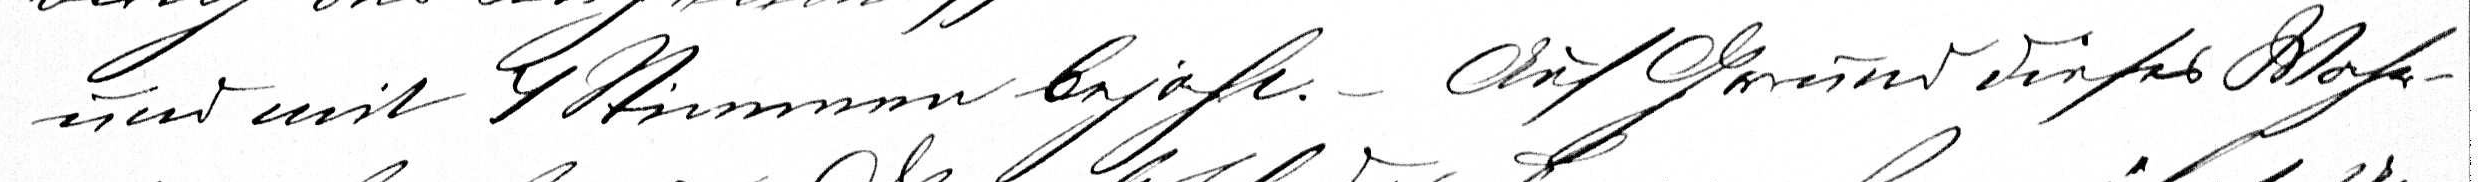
und mit 4 Stimmen bejaht. Auf Grund deises Wahr¬
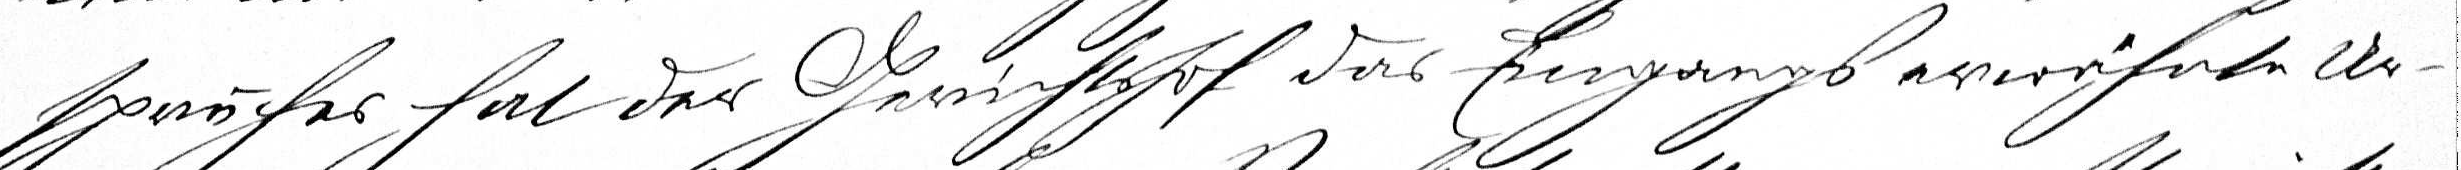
spruches hat er Gerichtshof das Eingangs erwähnte Ur¬
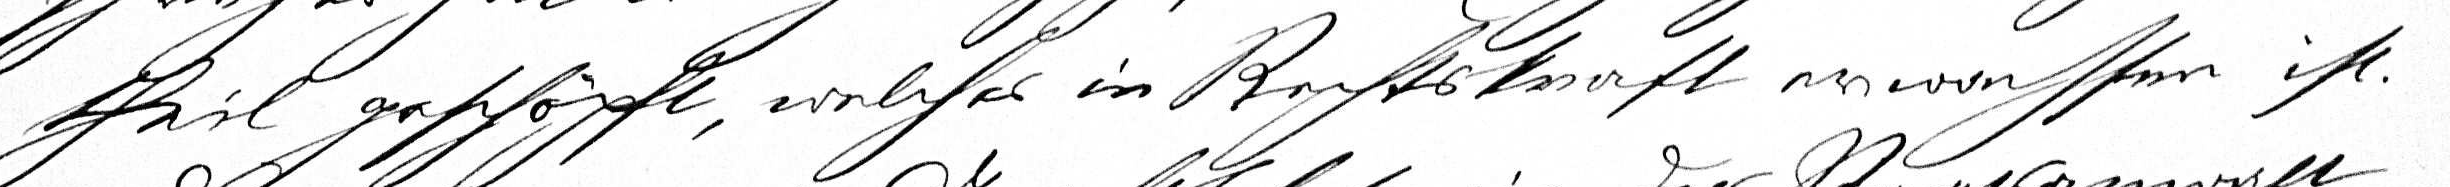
theil geschöpft, welches in Rechtskraft erwachsen ist.
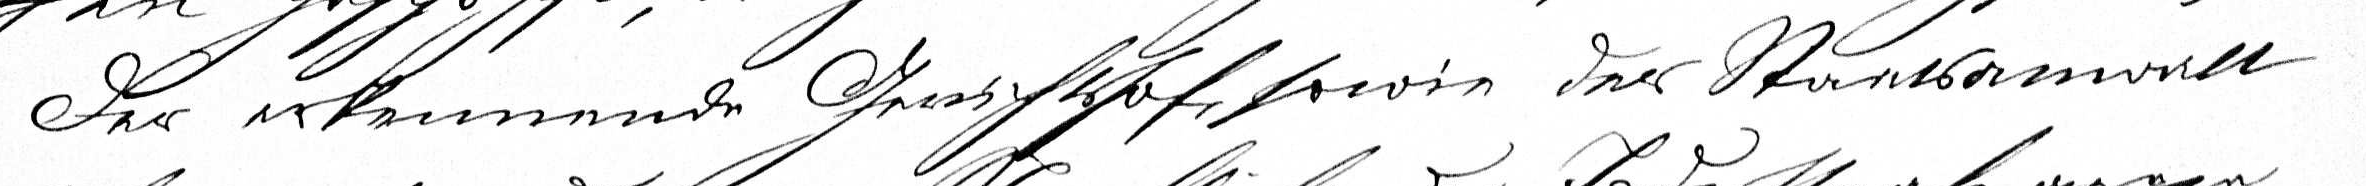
Der erkennende Gerichtshof, sowie der Staatsanwalt
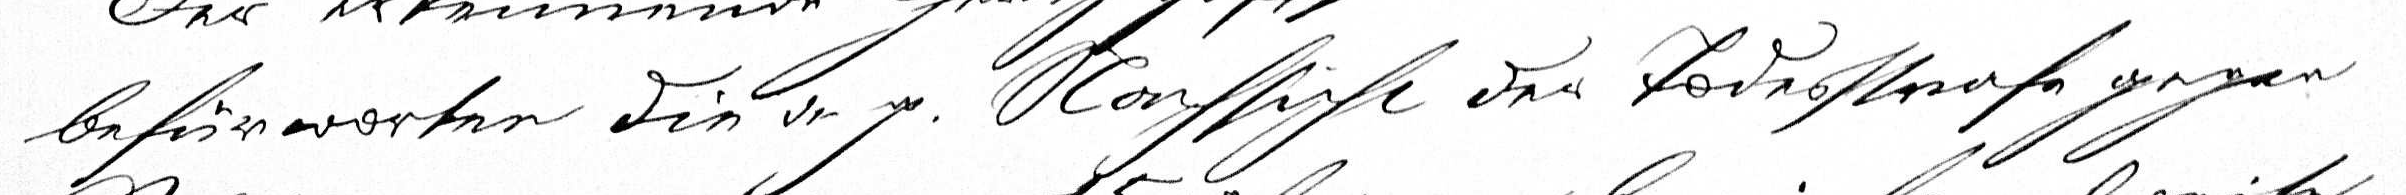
befürworten die a.g. Nachsicht der Todesstrafe gegen
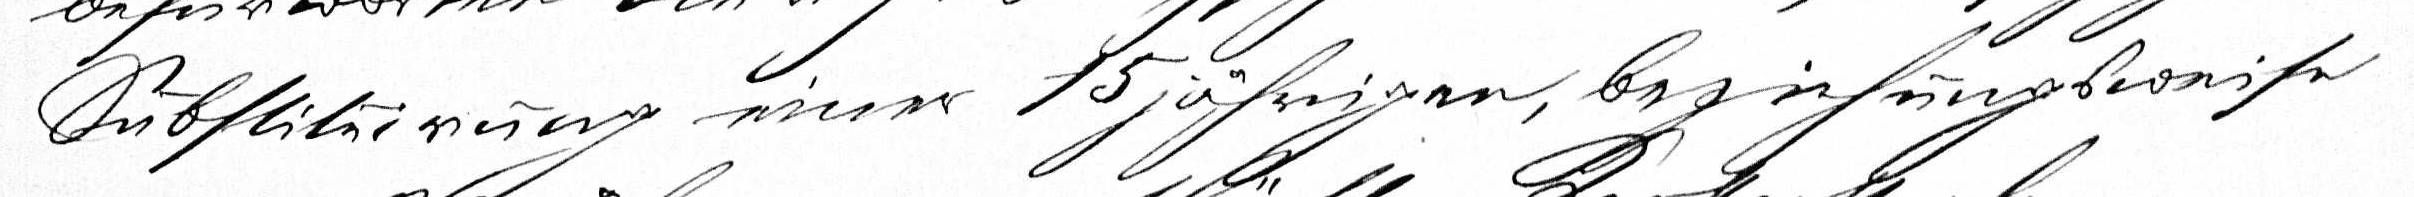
Substituirung einer 15jährigen, beziehungsweise
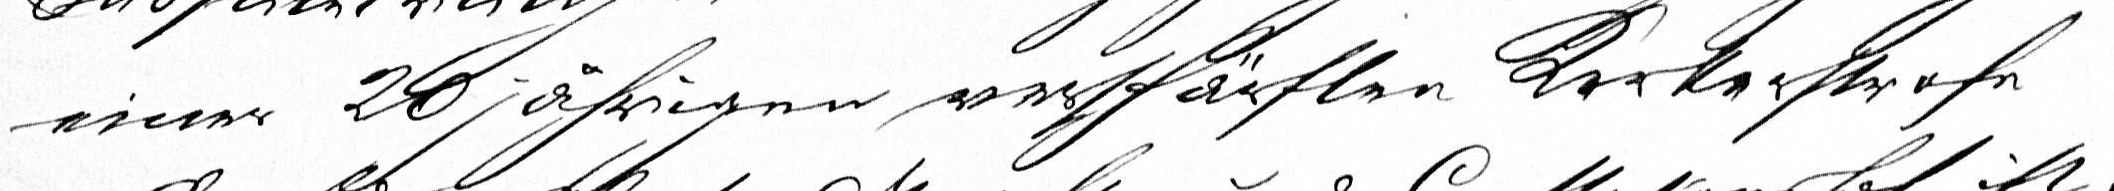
einer 20jährigen verschärften Kerkerstrafe.
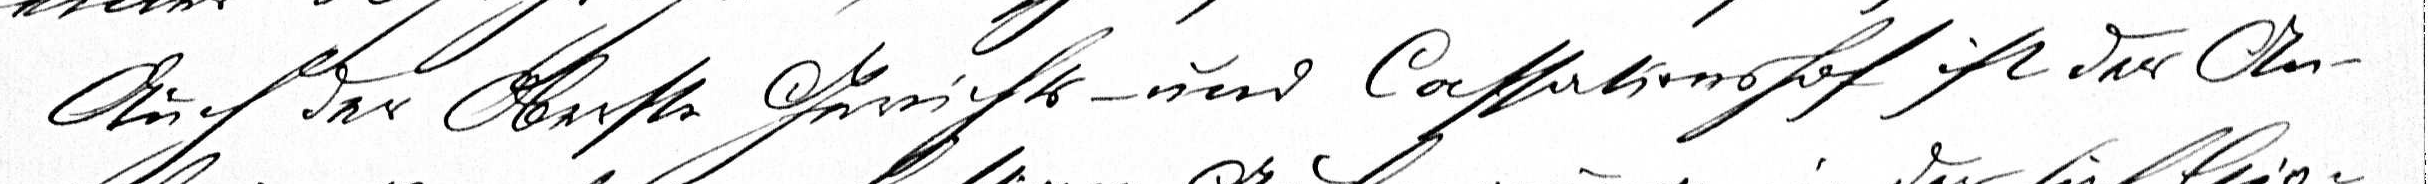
Auch der Oberste Gerichts- und Cassationshof ist der An¬
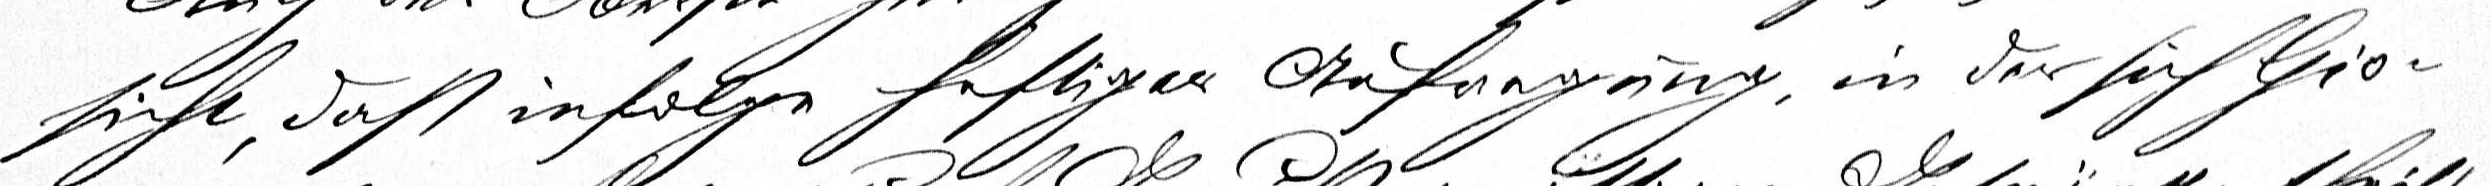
sicht, daß infolge heftiger Aufregung, in der sich Gio¬
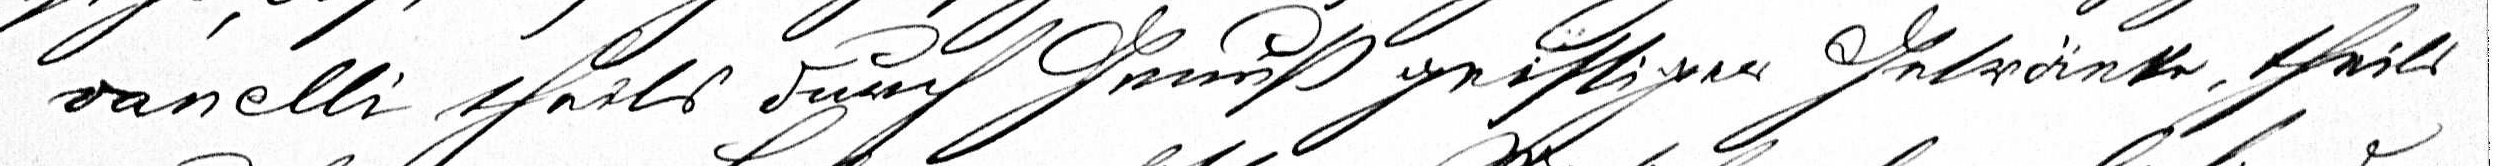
vanelli theils durch Genuß geistiger Getränke, theils
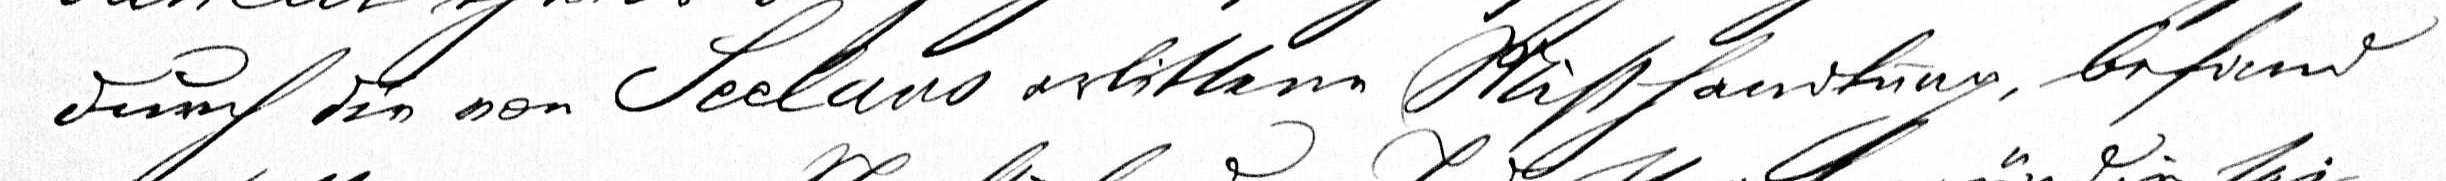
durch die von Seelaus erlittene Mißhandlugn befand
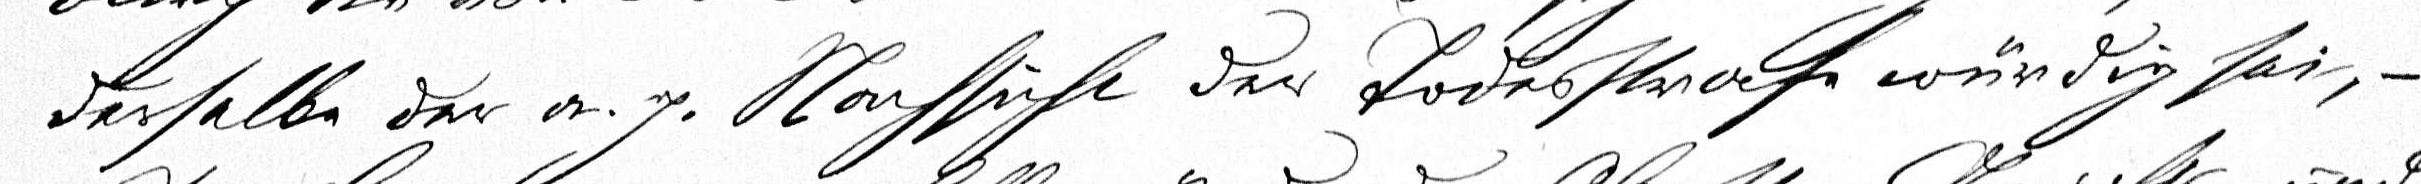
derselbe der a.g. Nachsicht der Todesstrafe würdig sei, ¬
